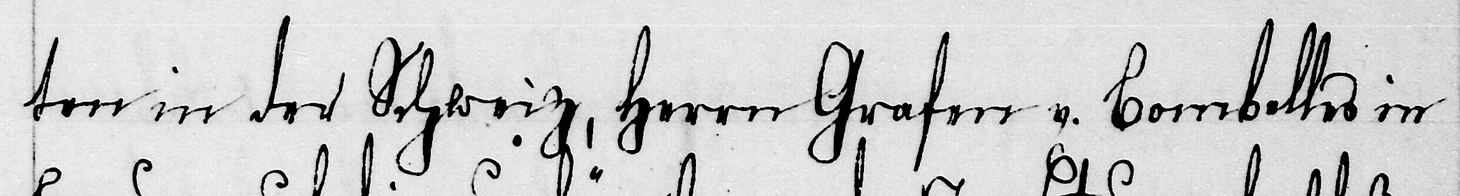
ten in der Schweiz, Herrn Grafen v. Bombelles in
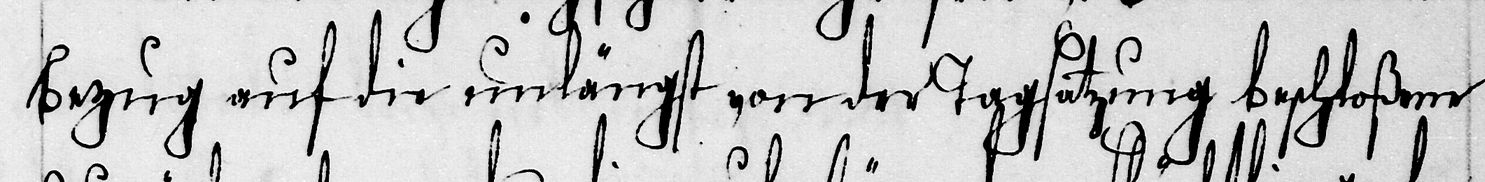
Bezug auf die unlängst von der Tagsatzung beschloßene
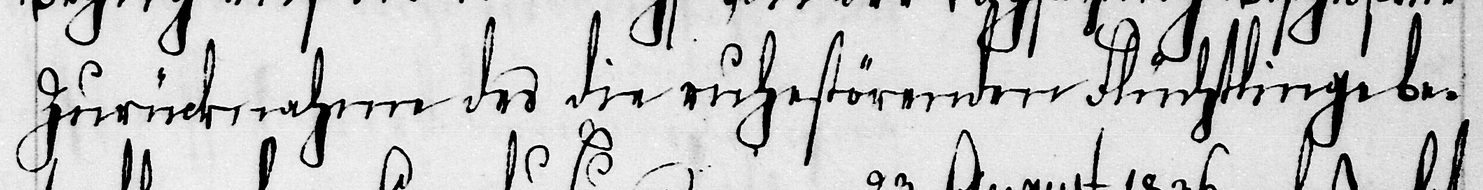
Zurücknahme des die ruhestörenden Flüchtlinge be¬
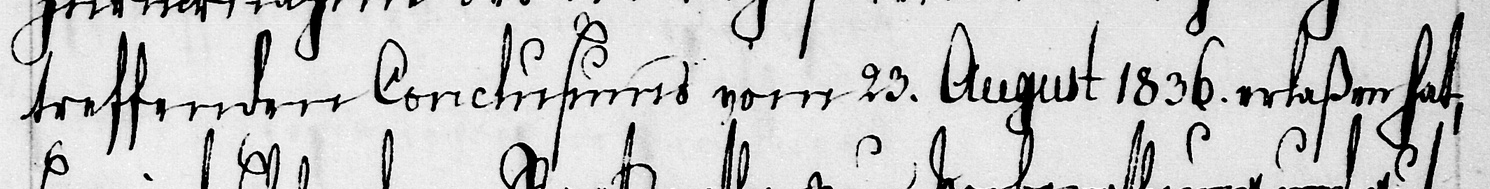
treffenden Conclusums vom 23. August 1836. erlaßen hat,
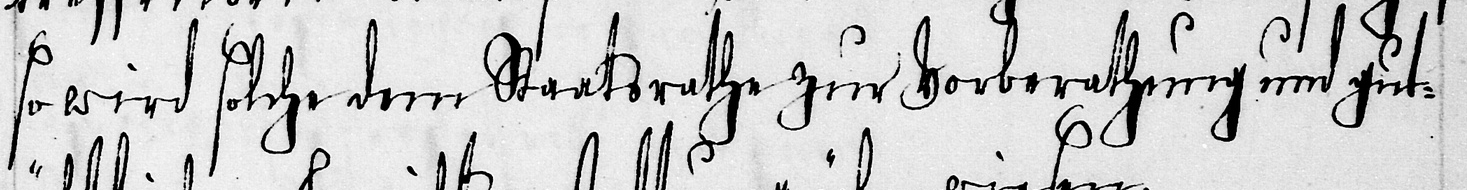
so wird solche dem Staatsrathe zur Vorberathung und gut¬
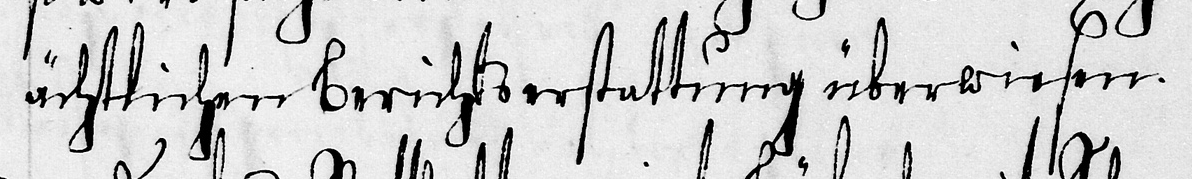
ächtlichen Berichtserstattung überwiesen.
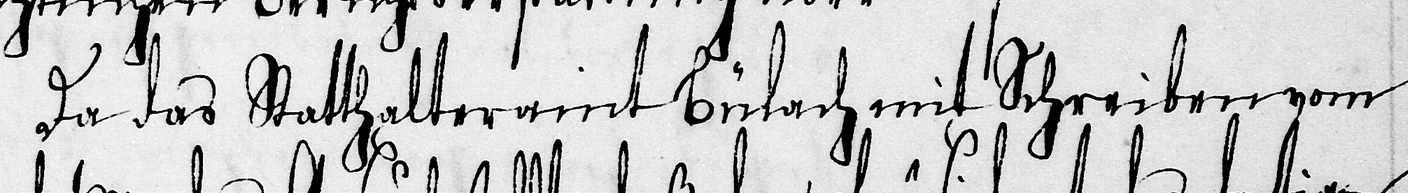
Da das Statthalteramt Bülach mit Schreiben vom
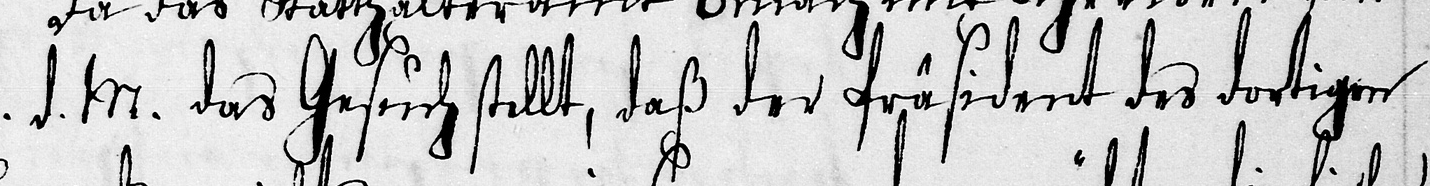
d. M. das Gesuch stellt, daß der Präsident des dortigen
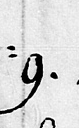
9.
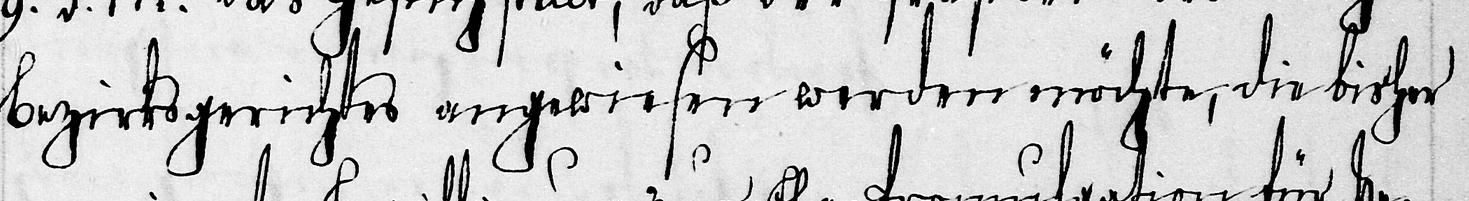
Bezirksgerichtes angewiesen werden möchte, die bisher
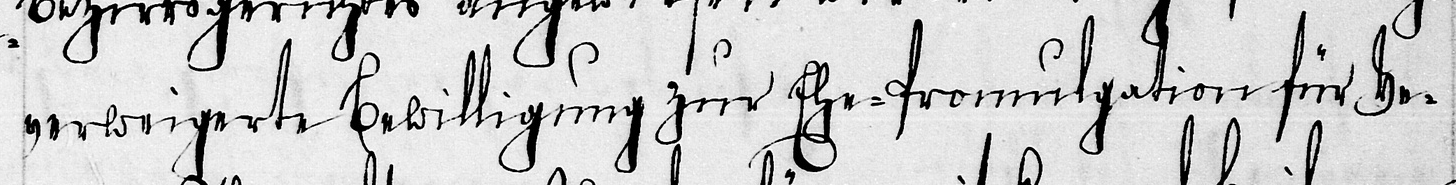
verweigerte Bewilligung zur Ehe-Promulgation für Ve¬
